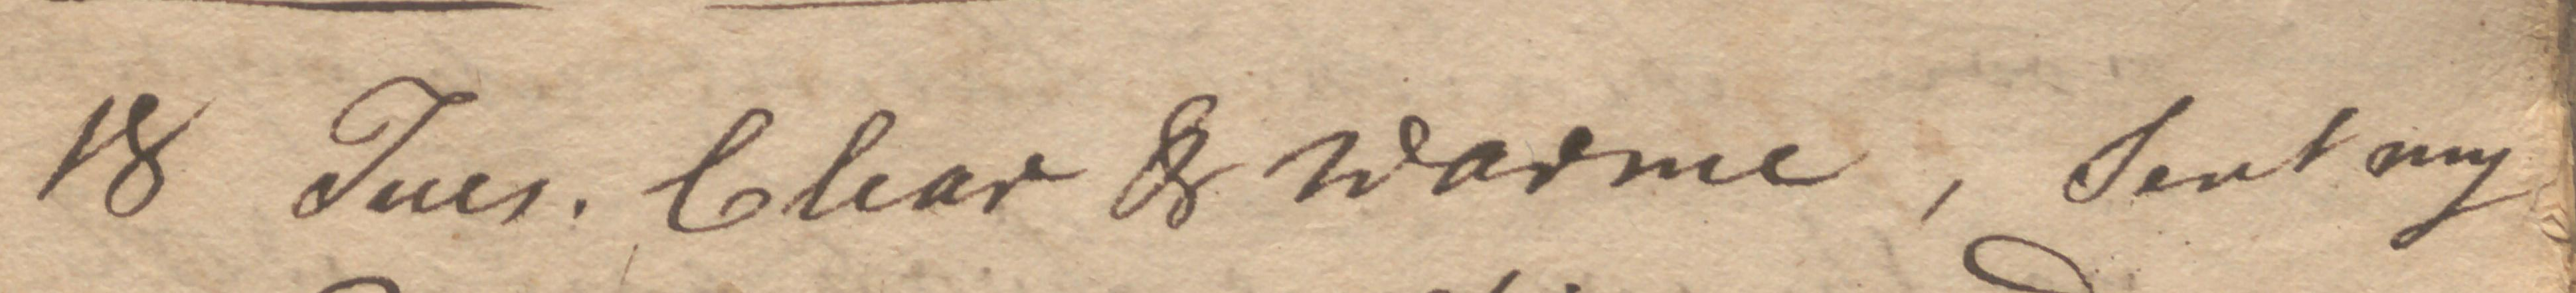18 Tues. Clear & Warme, Sent my
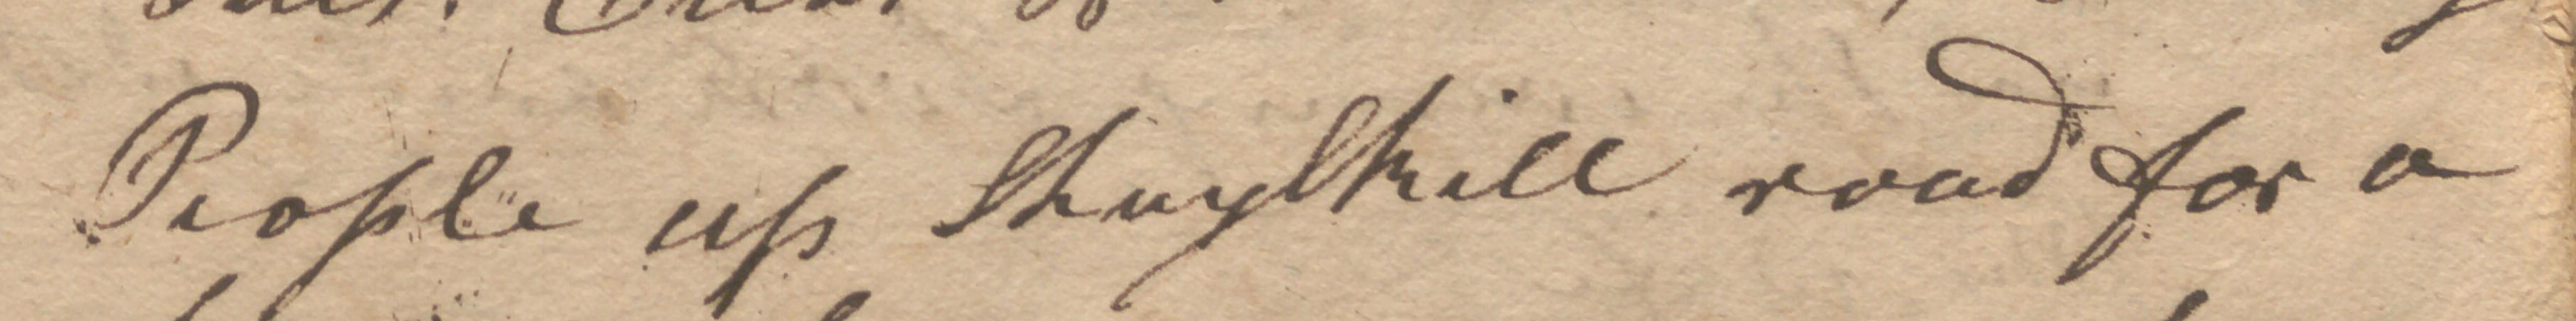People up Shuylkill road for a
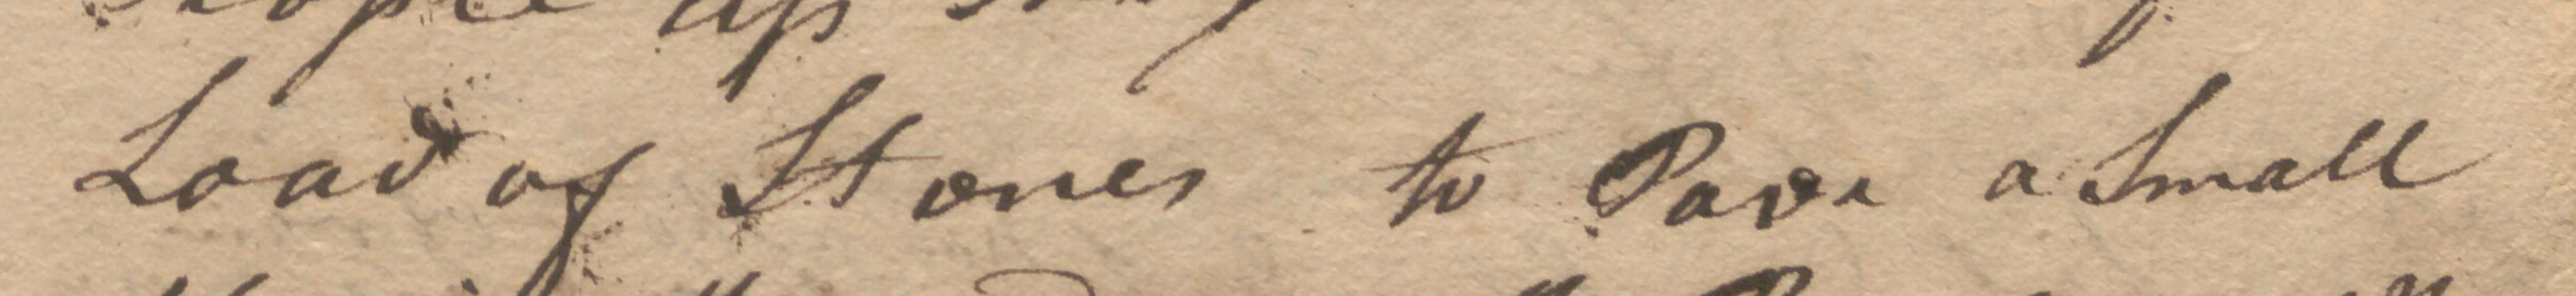Load of Stones, to Pave a small
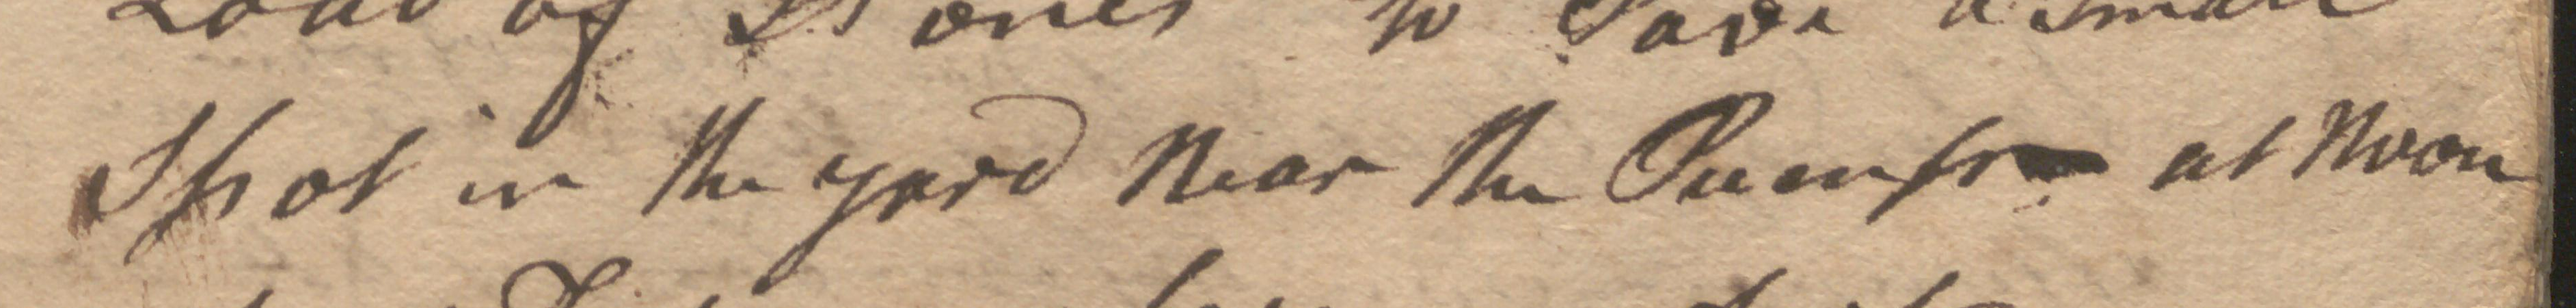Spot in the yard near the Pump at noon
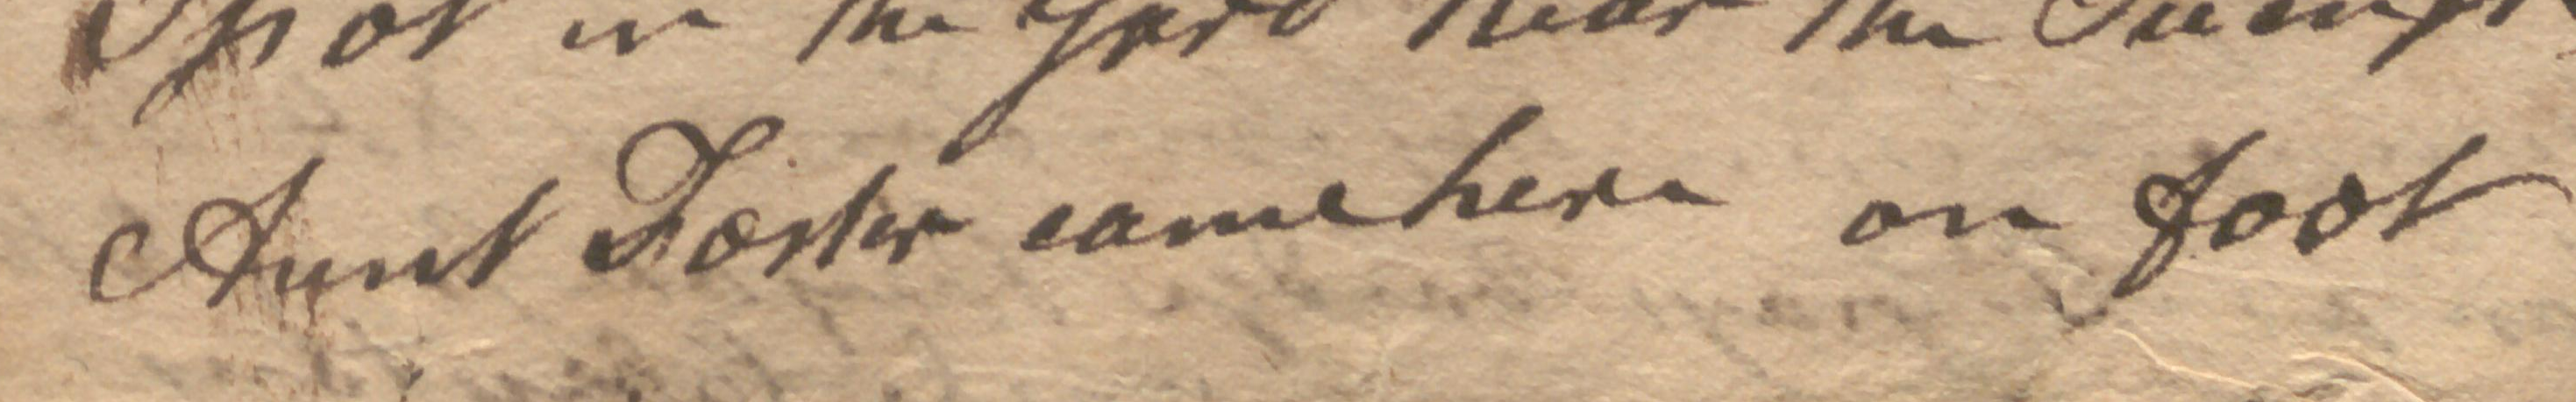Aunt Foster came here on foot
